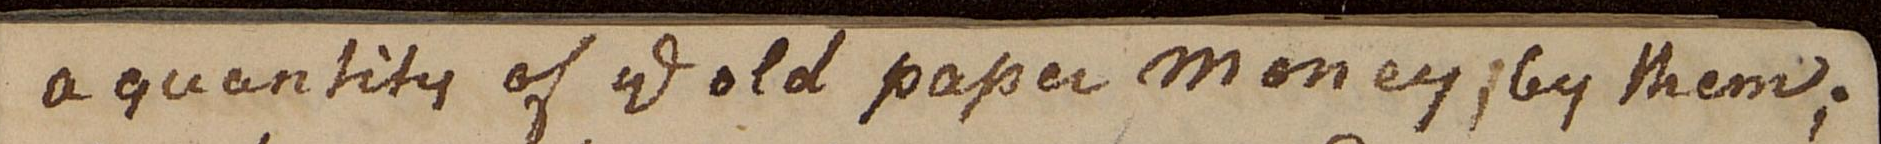a quantity of y^e old paper Money by them;
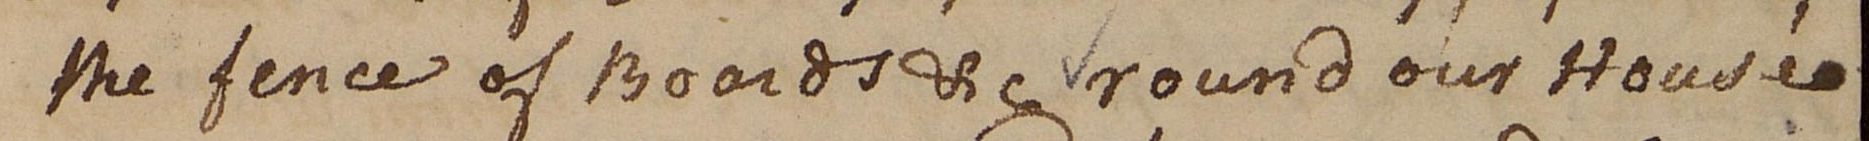the fence of Boards &c round our House
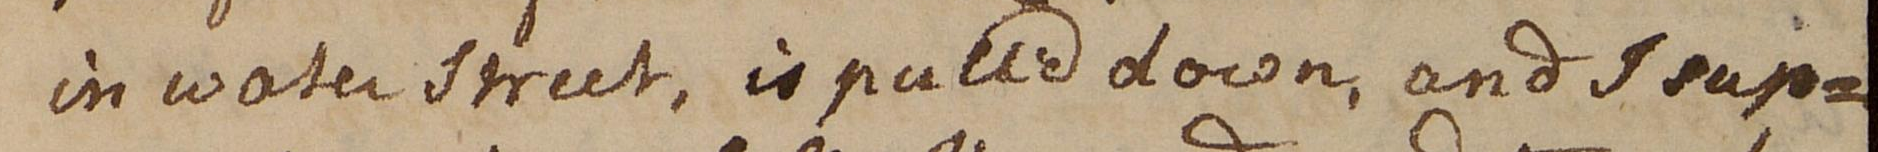in water Street, is pull'd down, and I sup-
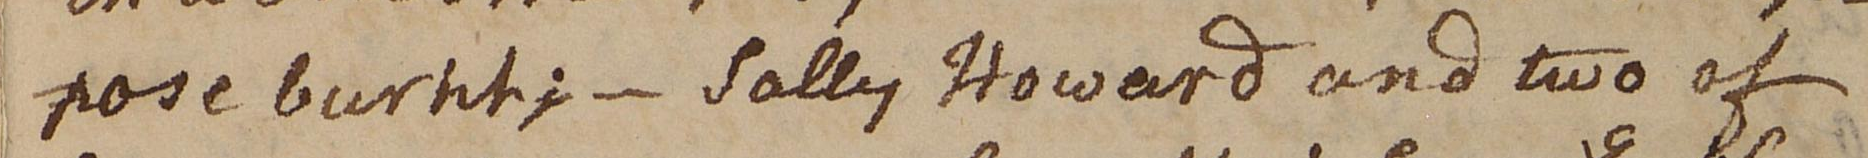-pose burtihj?- Sally Howard and two of
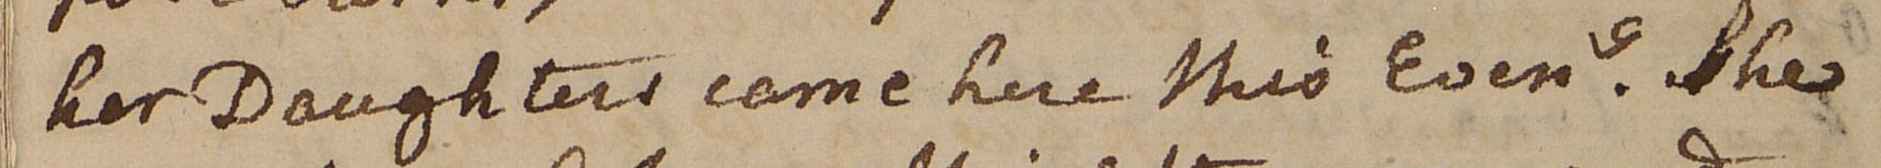her Daughters came here this Even^g. she
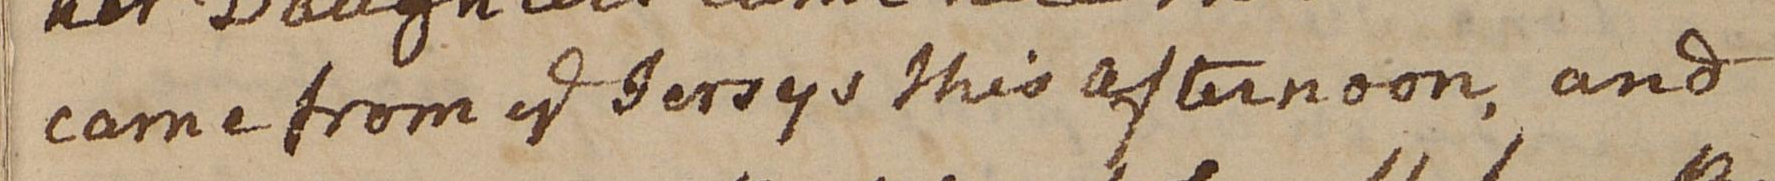came from y^e Jersys this Afternoon, and
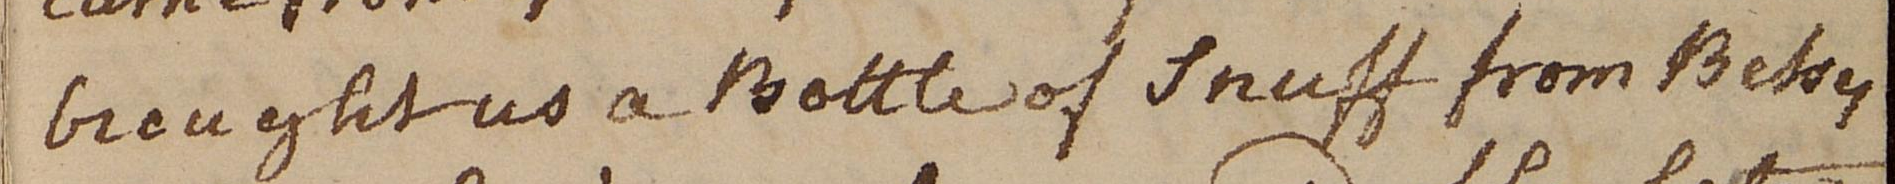brought us a Bottle of Snuff from Betsy
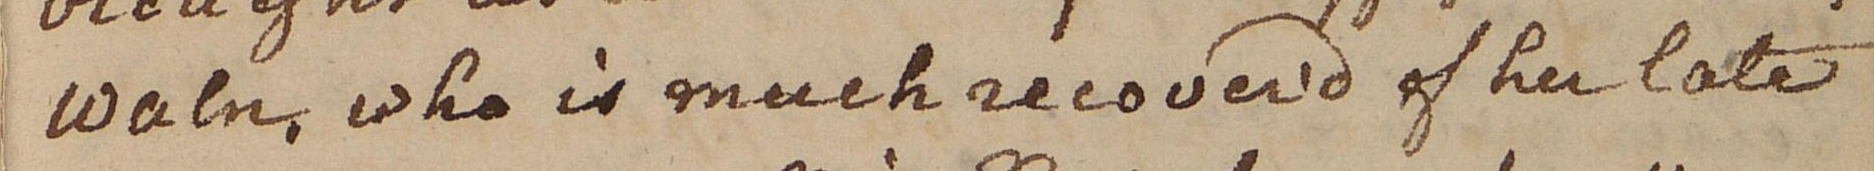Waln, who is much recover'd of her late
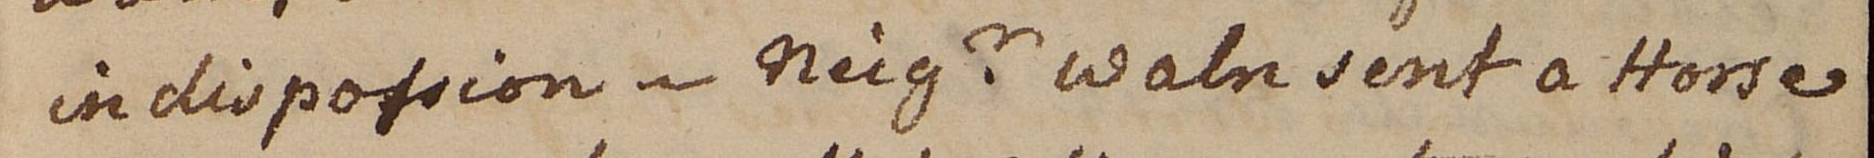indispossion- Neig^r. Waln sent a Horse
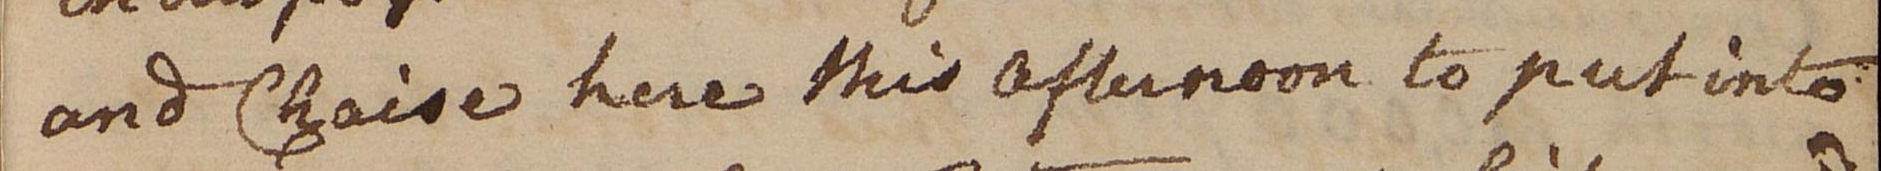and Chaise here this afternoon to put into
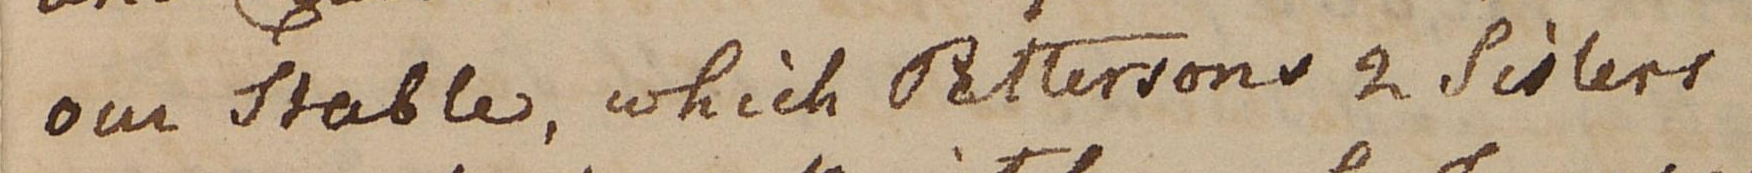our Stable, which Pattersons 2 Sisters
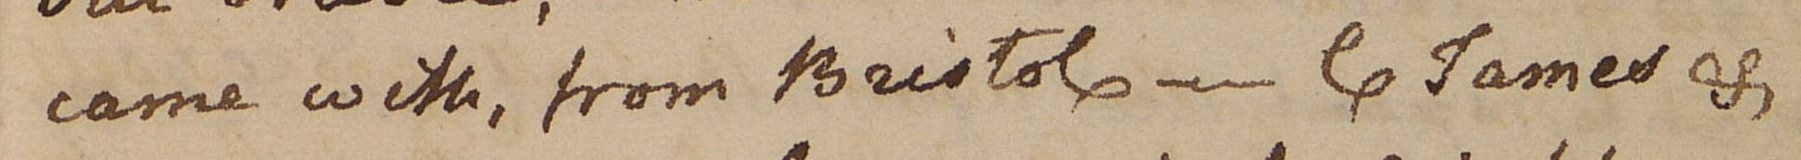came with, from Bristol- C James&
